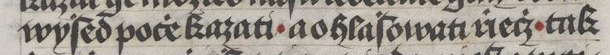wyẛed poċe kazati.a ohlaẛowati ṙiecż.tak
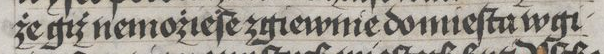że giż nemożieẛe zgiewnie do mieſta wgi¬
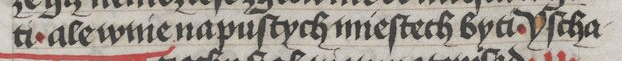ti.ale wnie na puſtych mieſtech byti.Yſcha¬
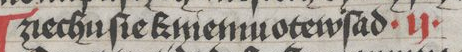zíechu ſie kniemu otewẛad. ij.
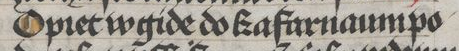Opiet wgide do kafarnaum po¬
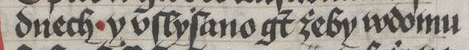dnech.y vſlyẛano ḡt żeby wdomu
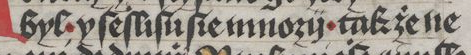byl.yſeẛliſú ſie mnozij.tak że ne¬
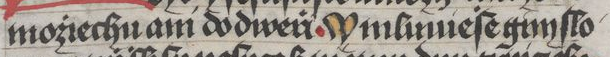możíechu ani do dweṙi.Y mluvieẛe gim ſlo¬
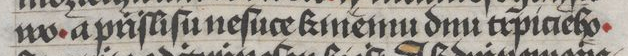wo.a pṙiẛli ſu neſuce kníemu dnu trpícíeho.
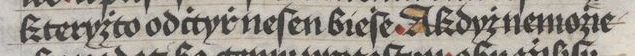kteryżto od ċtyṙ neſen bíeẛe A kdyż nemożie¬
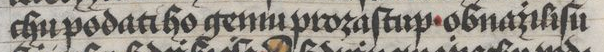chu podati ho gemu prozaſtup.obnażiliſu
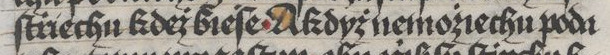ſtṙíechu kdeż bíeẛe.A kdyż nemożiechu poda¬
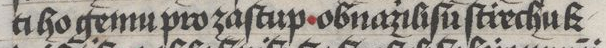ti ho gemu pro zaſtup.obnażiliſi ſtṙechu k¬
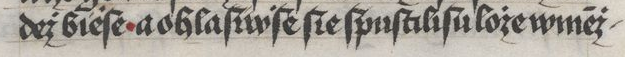deż bieẛe.a ohlaſiwẛe ſie ſpuſtilu ſu loże wniēż
